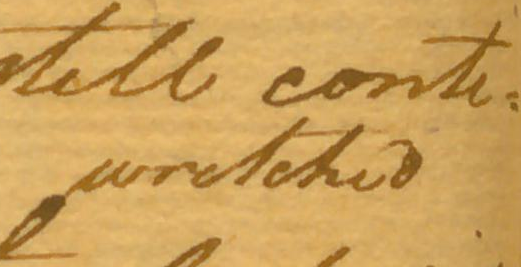wretched
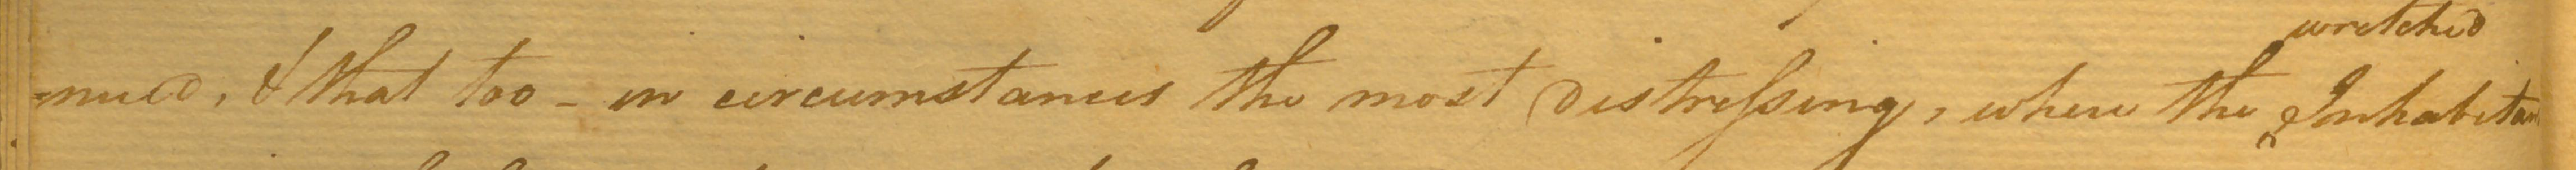-nued, & that too- in circumstances the most distressing, when the ^ Inhabitants
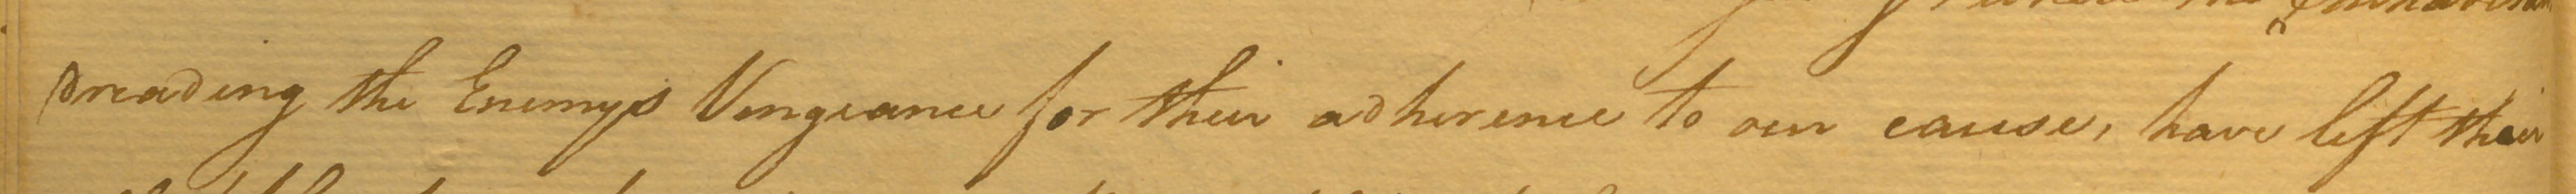dreading the Enemys Vengeance for their adherence to our cause, have left them
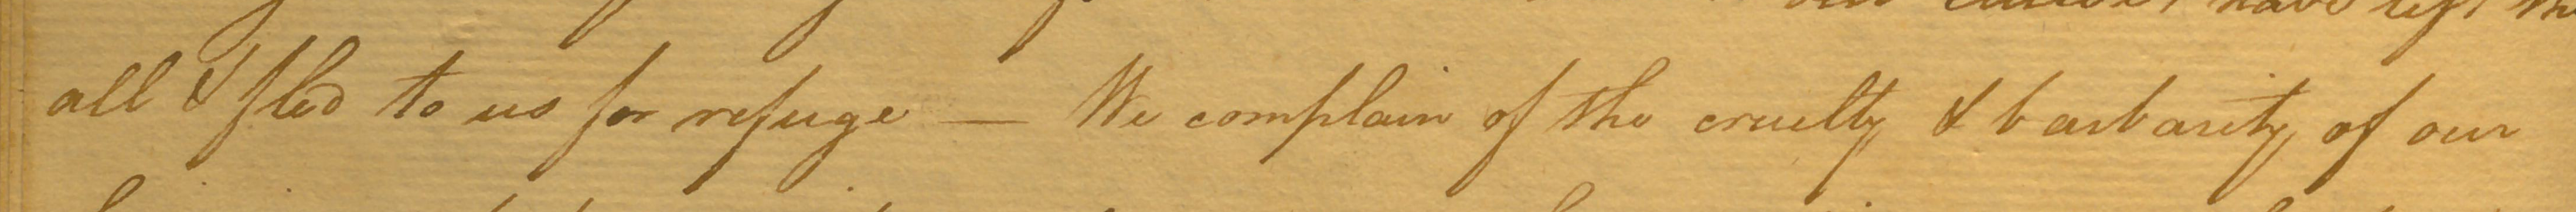all & fled to us for refuge- We complain of the cruelty & barbarity of our
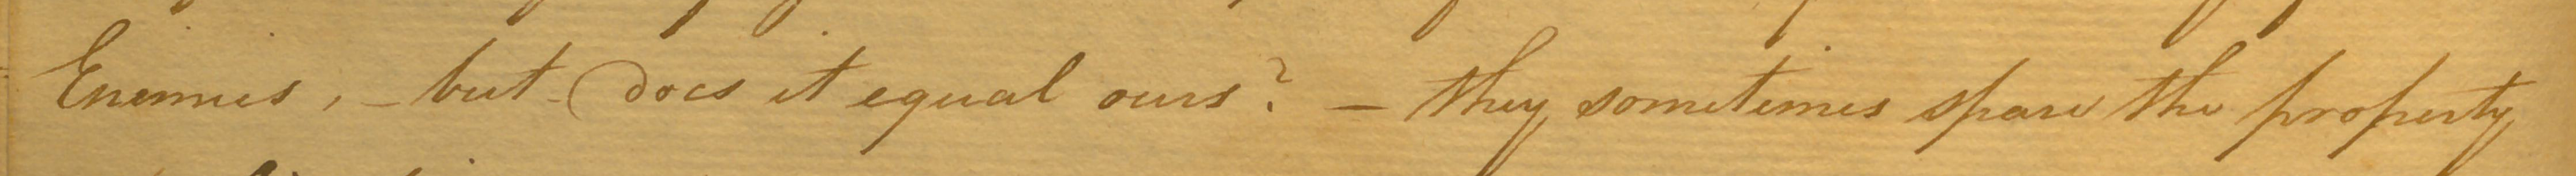Enemies,- but does it equal ours?- they sometimes spare the property
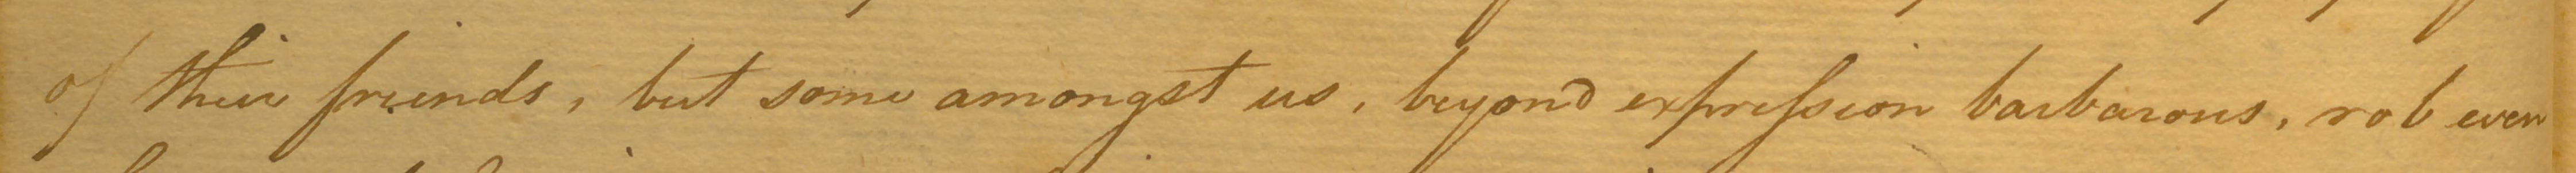of their friends, but some amongst us, beyond expression barbarous, rob even
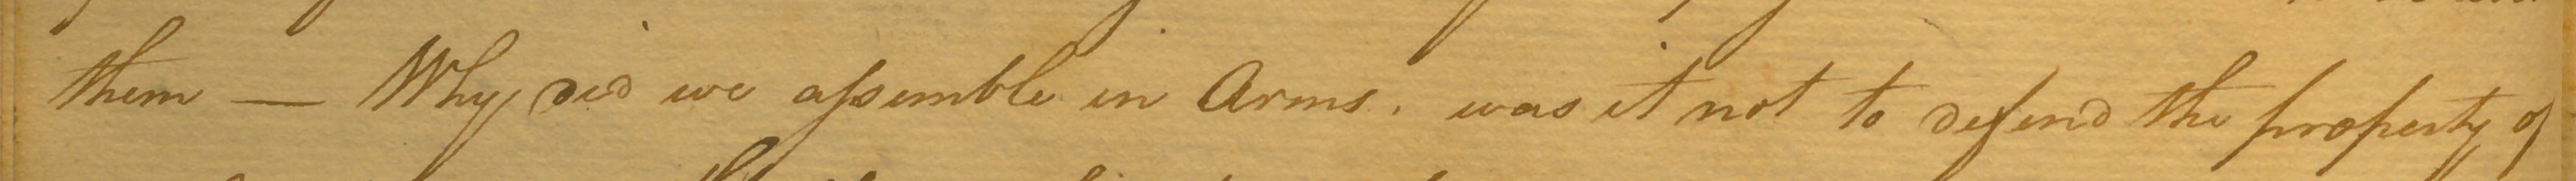them- Why did we assemble in Arms. was it not to defend the property of
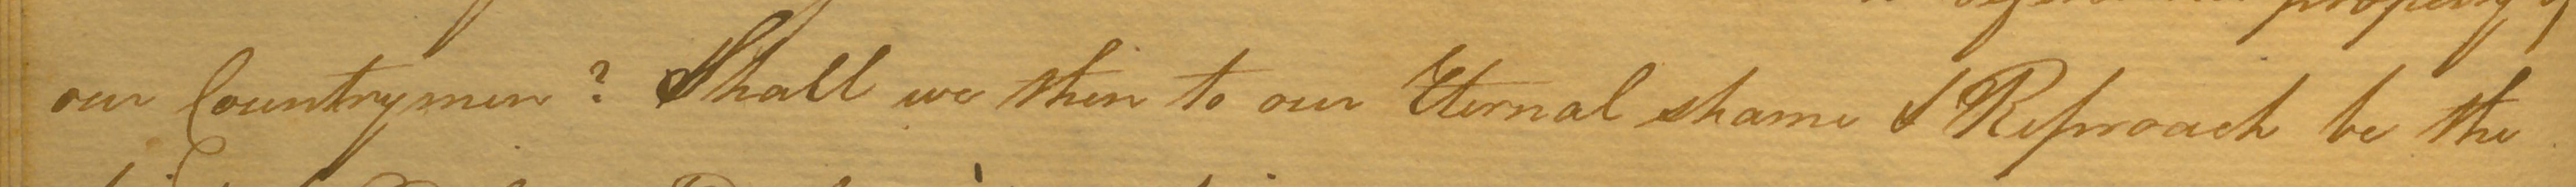our Countrymen? Shall we then to our Eternal shame & Reproach be the
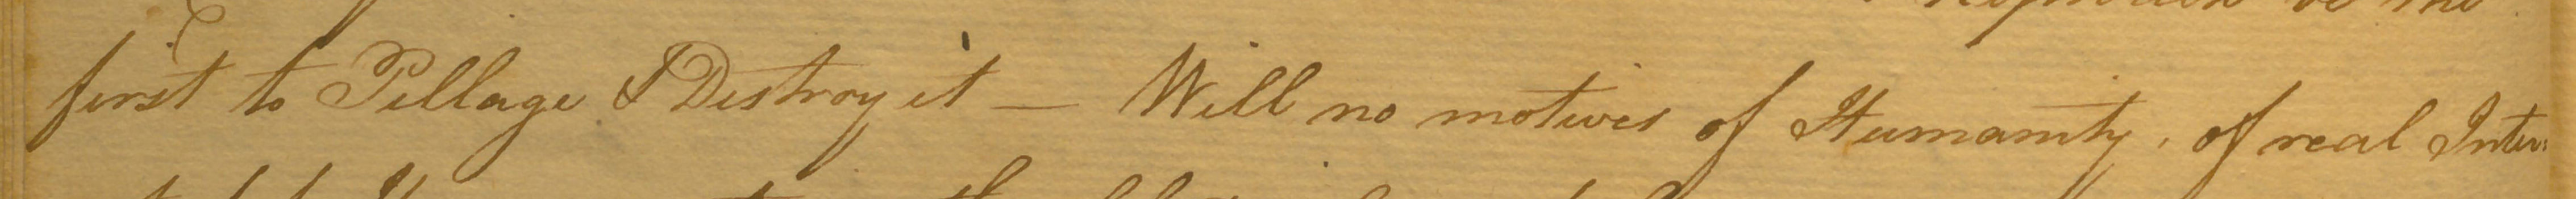first to Pillage & Destroy it- Will no motives of Humanity, of real Inter
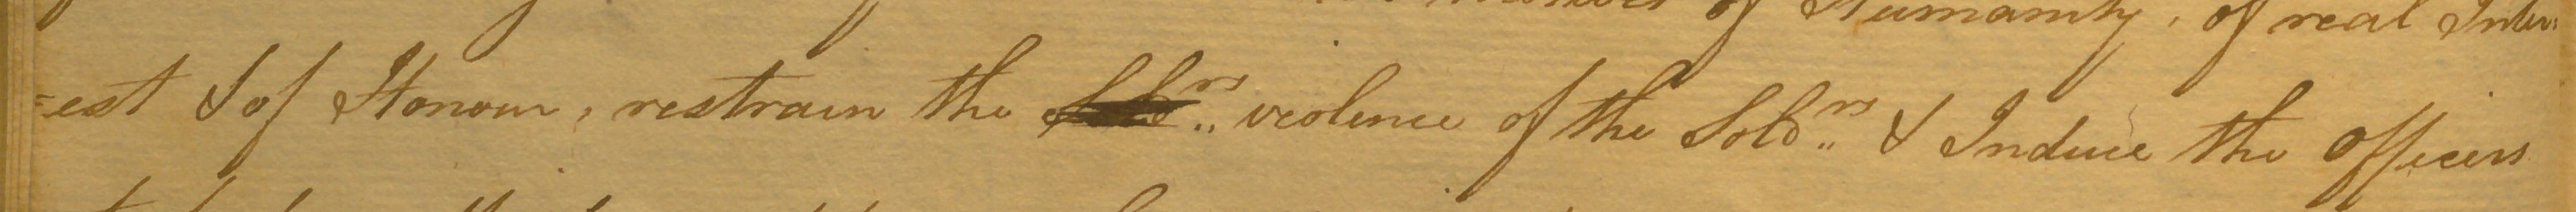-est & o Honour, restrain the [______] violence of the Sold^rs. & Induce the Officers
